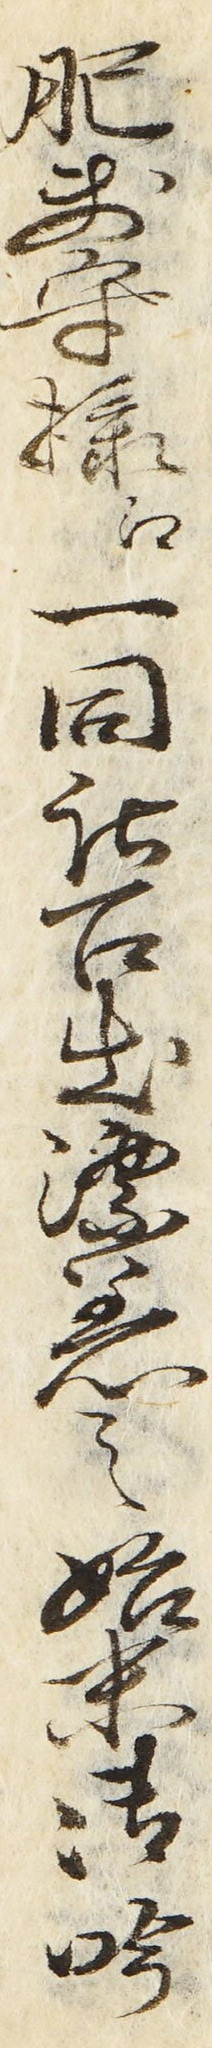肥前守様江一同被召出漂着之始末御吟
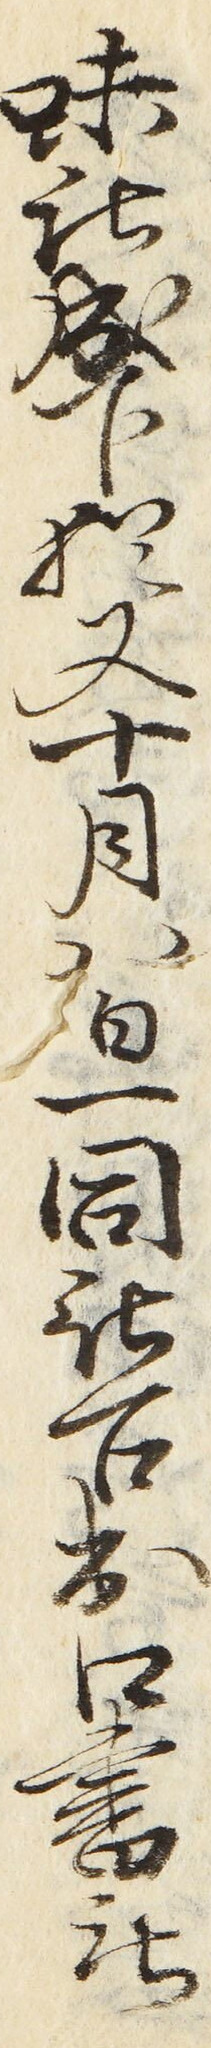味被成下猶又十月八日一同被召出口書被
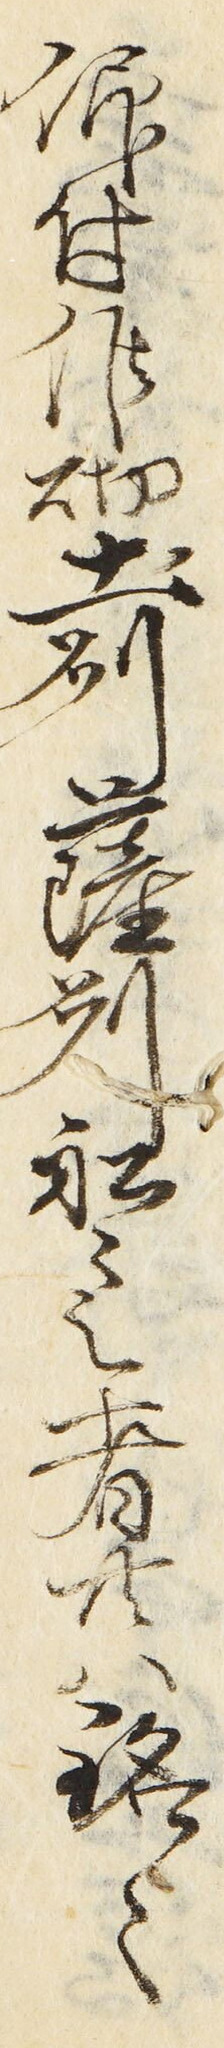仰付候砌土州薩州船々之者共ハ銘々
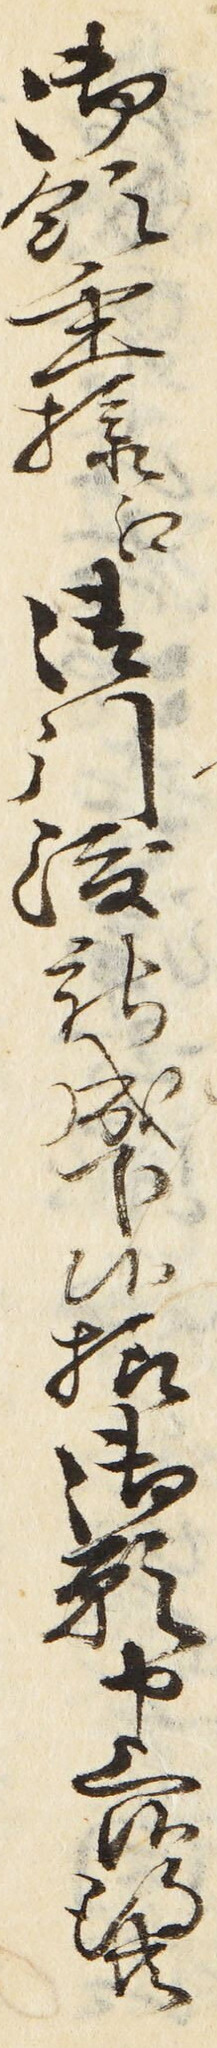御領主様江御引渡被成下候様御願申上候得共
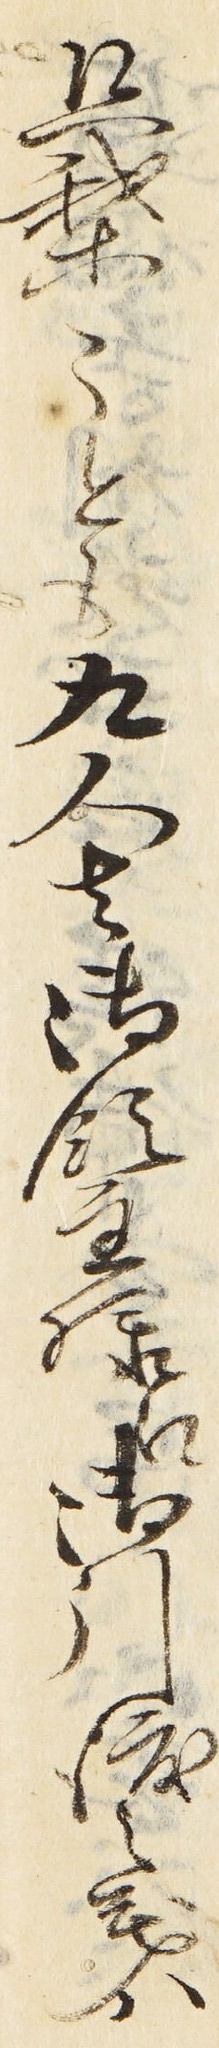且我等ことも九人者御領主様江御引渡之義ハ
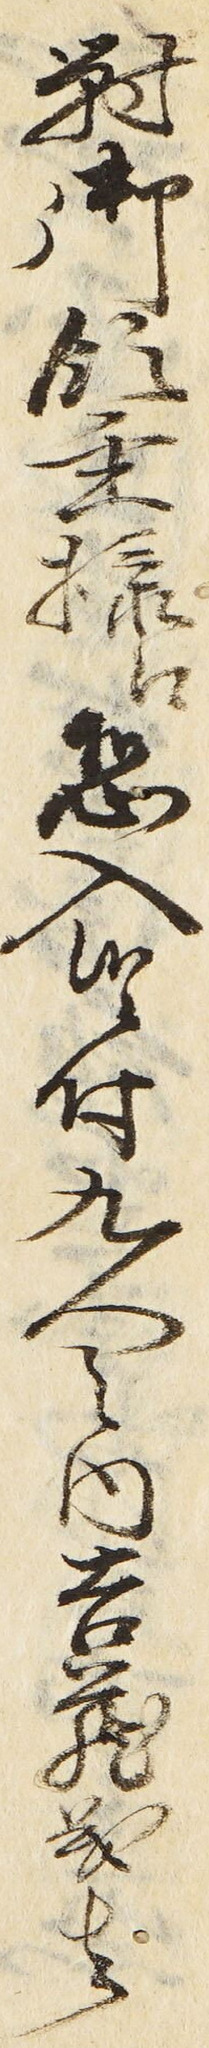対御領主様江恐入候ニ付九人之内吉蔵義者
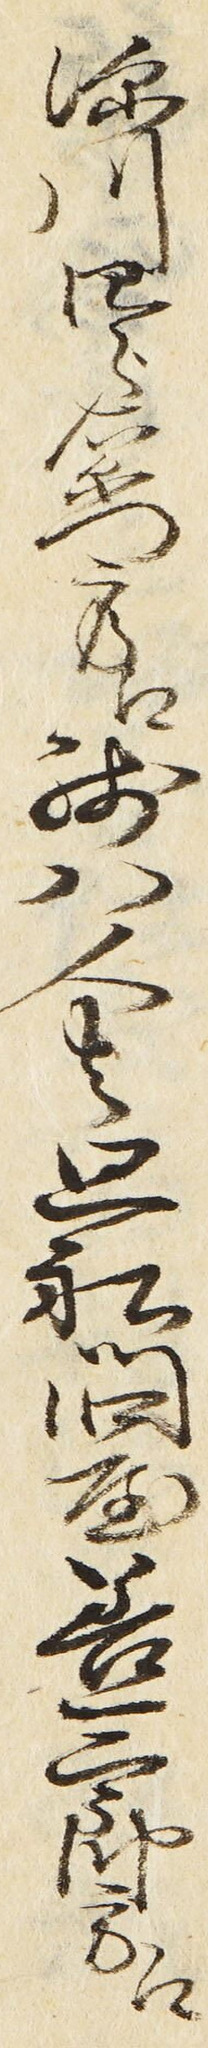深川四郎右衛門方江残八人者廻船問屋善三郎方江
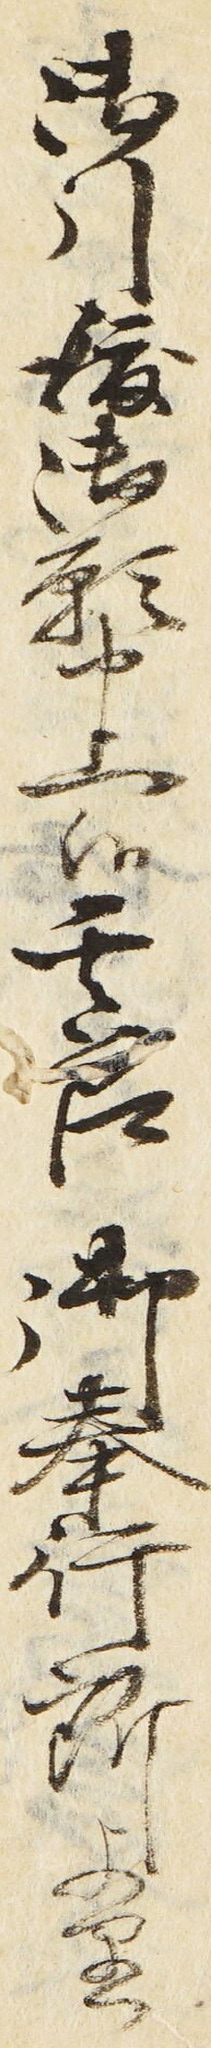御引渡御願申上候其節御奉行所より
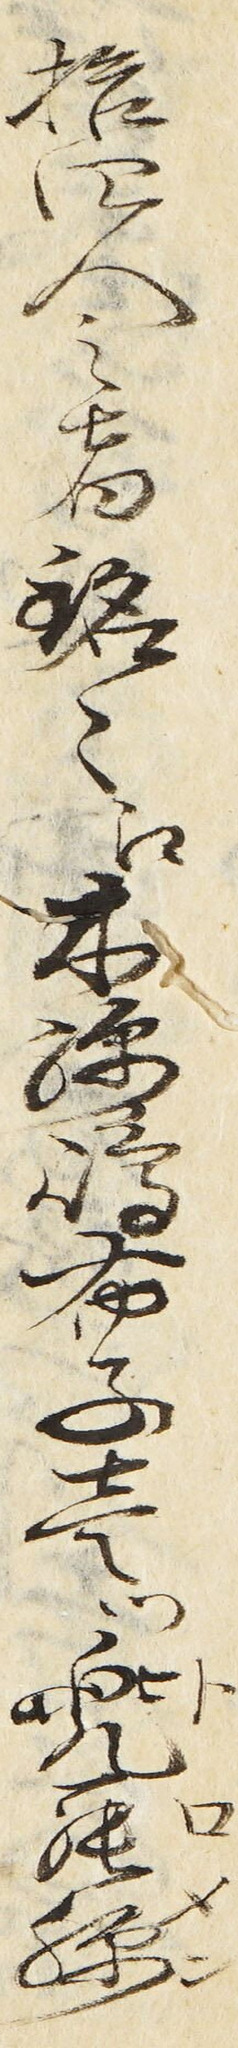拾四人之者銘々江木綿嶋布子壱ツ兜羅綿
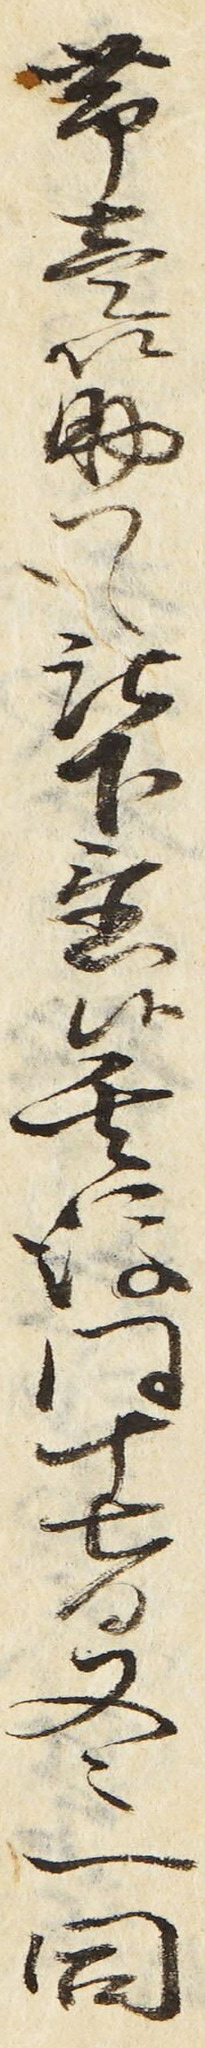帯壱筋ツヽ被下置候其後同十七日又々一同
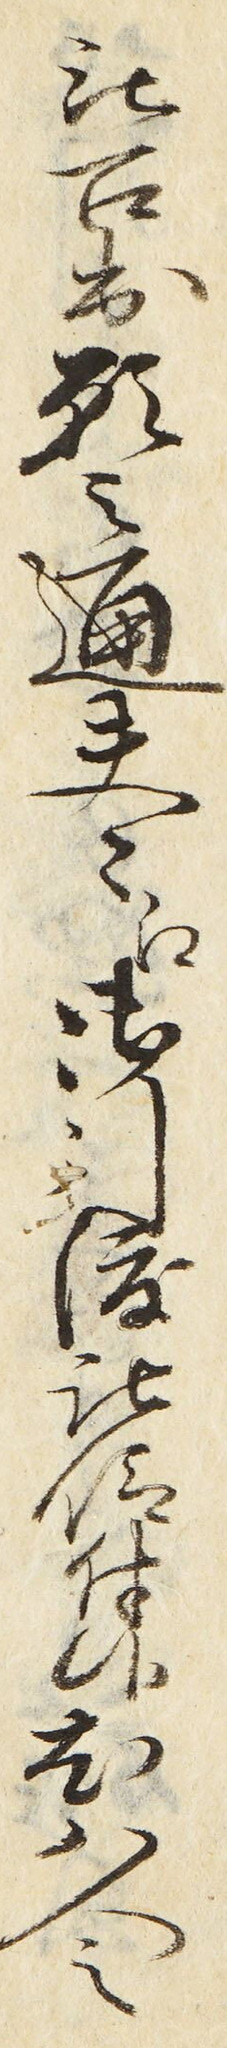被召出願之通夫々江御引渡被仰付候尤八人之
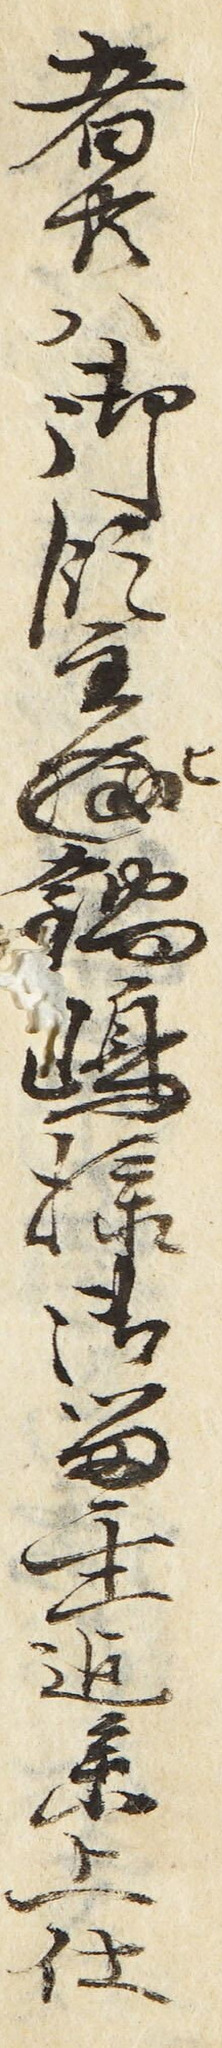者共ハ御領主鍋島様御留守迄参上仕
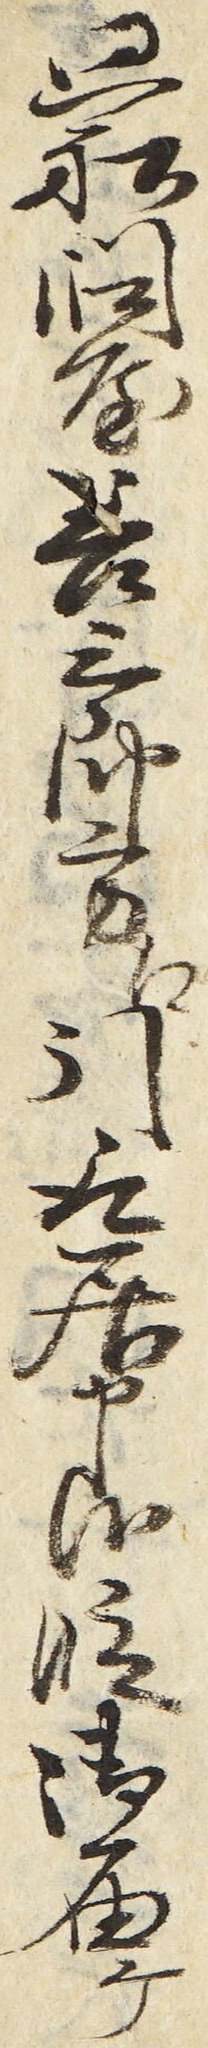廻船問屋善三郎方江引取居申候段御届け

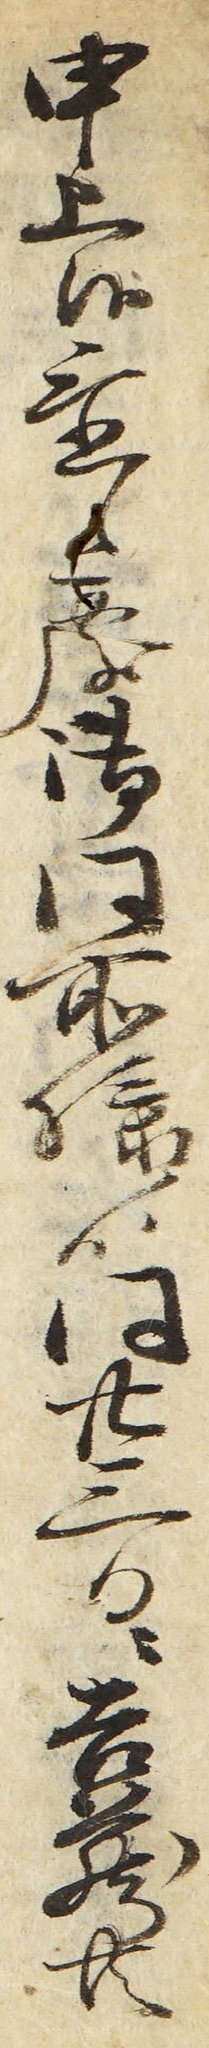申上候置候処御同所様ゟ同廿三日ニ吉蔵共
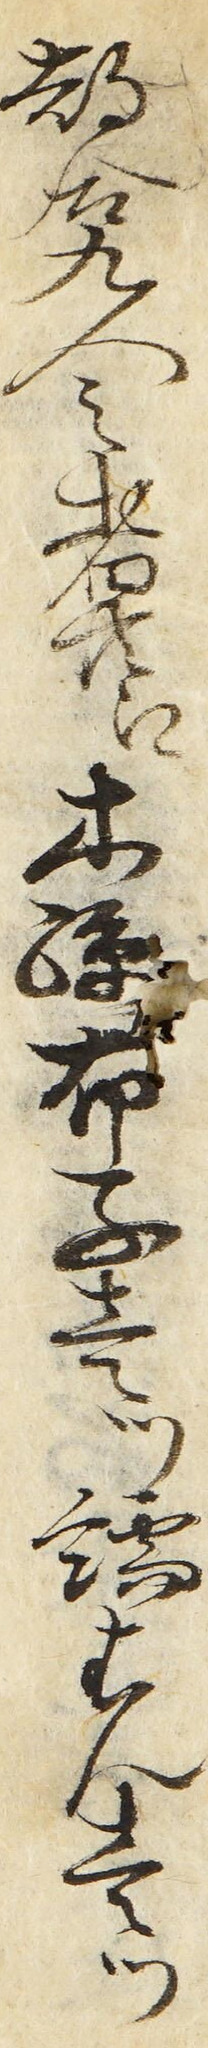都合九人之者共江木綿布子壱ツ繻はん壱ツ
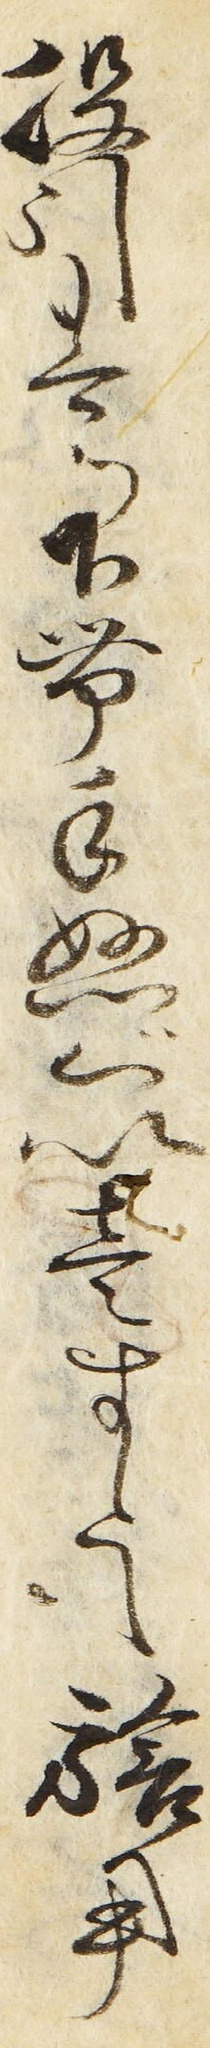股引壱ツ下帯手ぬぐい壱すじ旅用
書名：漂流一件上書
